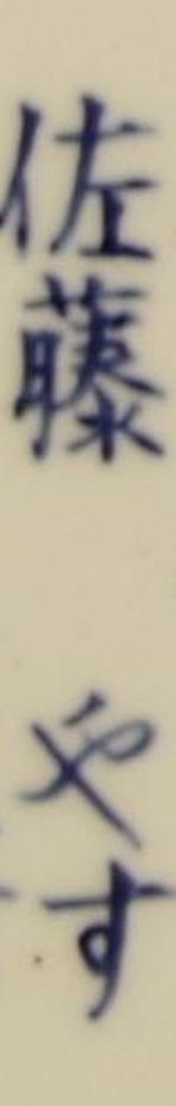佐藤やす
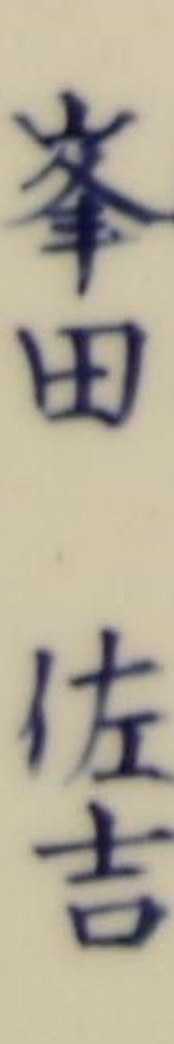峯田佐吉
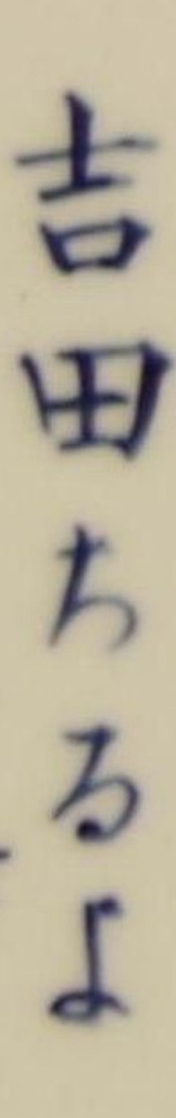吉田ちるよ
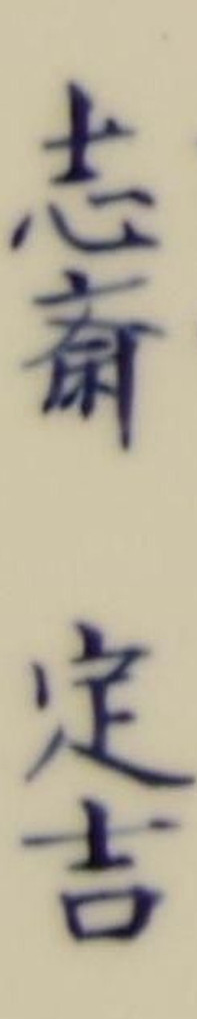志斎定吉

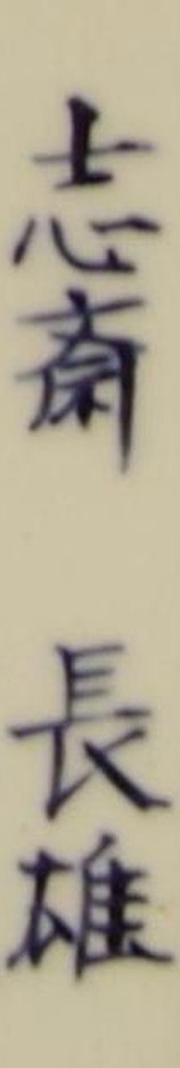志斎長雄
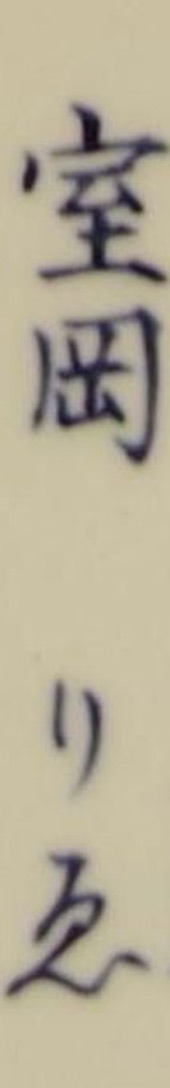室岡りゑ
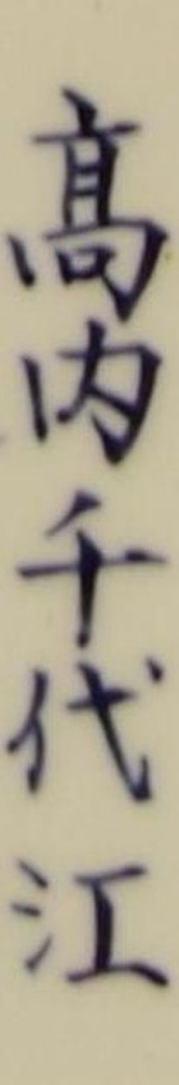高内千代江
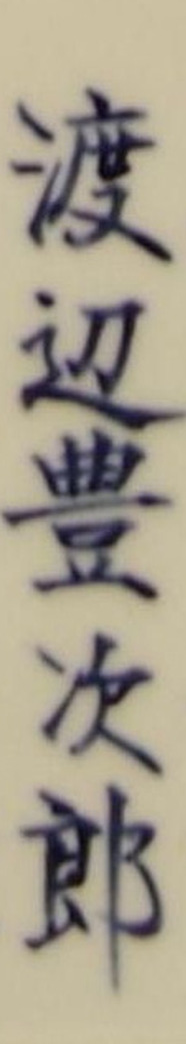渡辺豊次郎
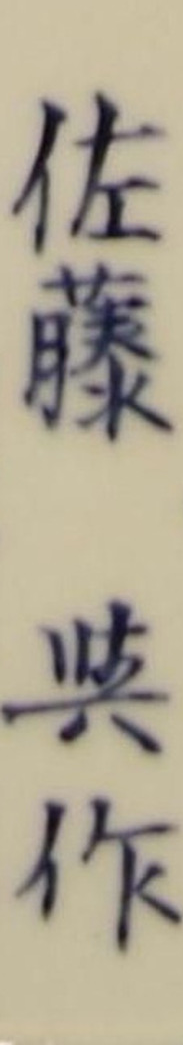佐藤与作
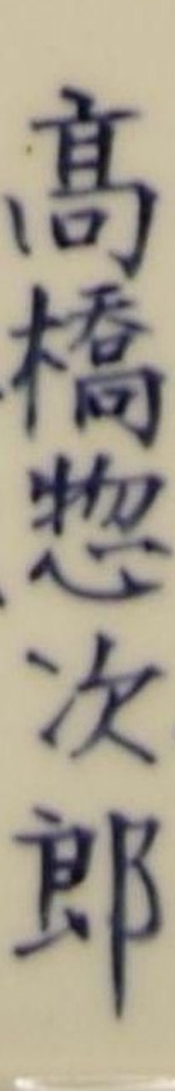高橋惣次郎
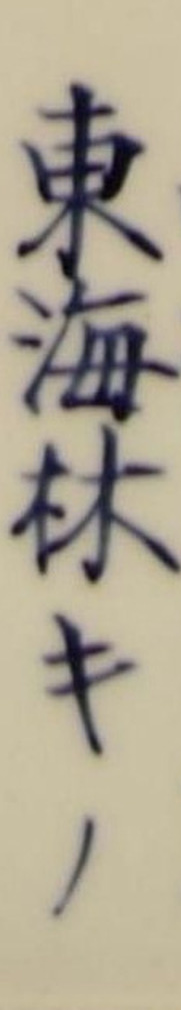東海林キノ
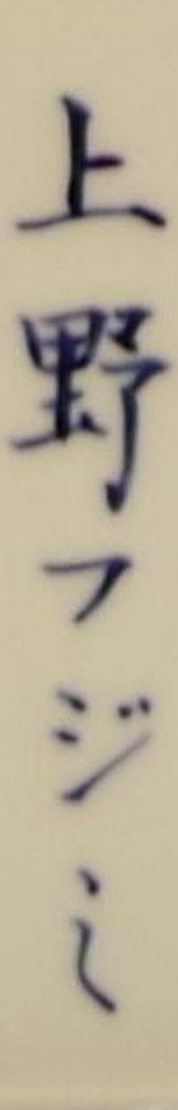上野フジミ
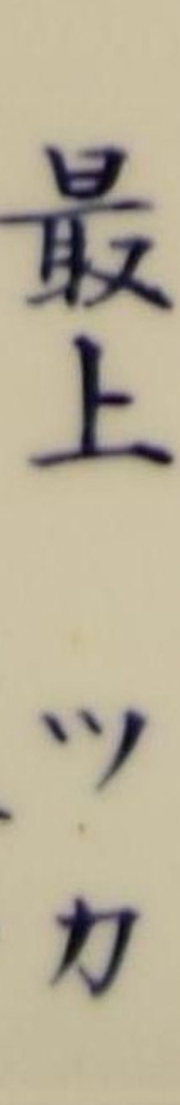最上ツカ
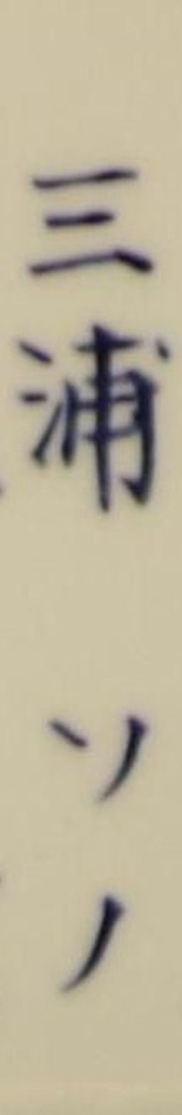三浦ソノ
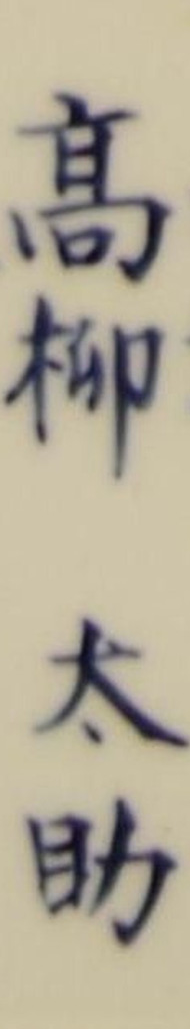高柳太助
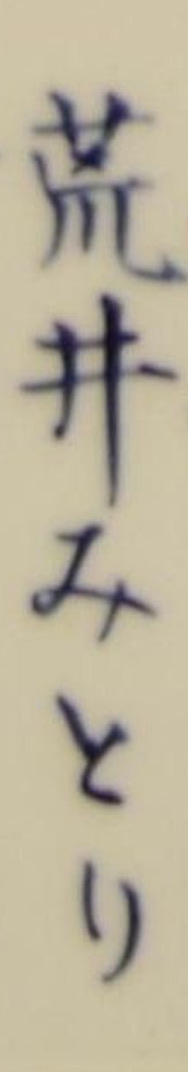荒井みとり
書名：A~D
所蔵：koyasan kongobuji
